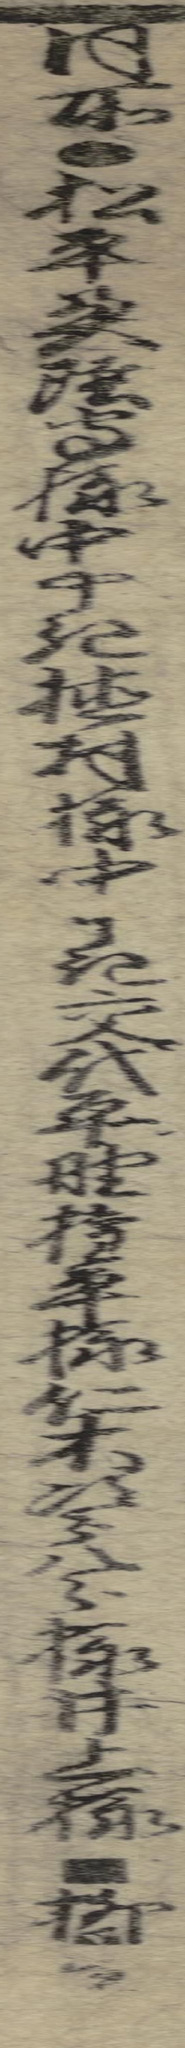同所●松平奥陸守様中やしき植村様中やしき交代平野権平様仁木次郎八郎様井上様柳生
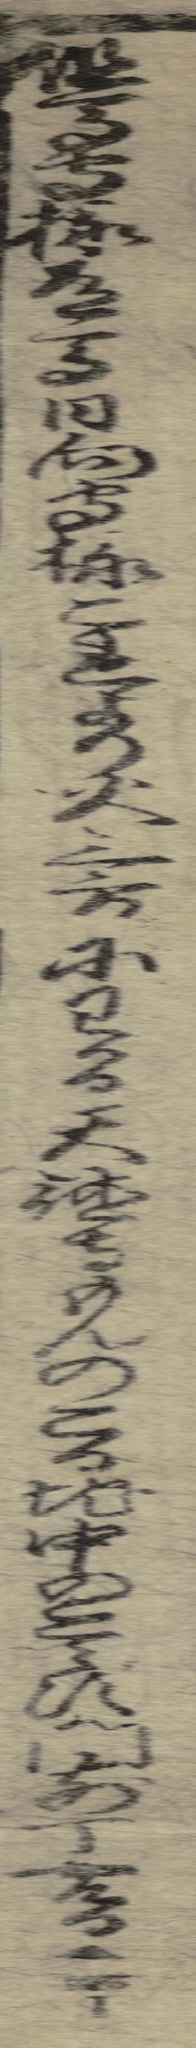但馬守様有馬日向守様これより火三方にわかるゝ天徳寺もんのこる地中のこらす門前丁やける▲下
